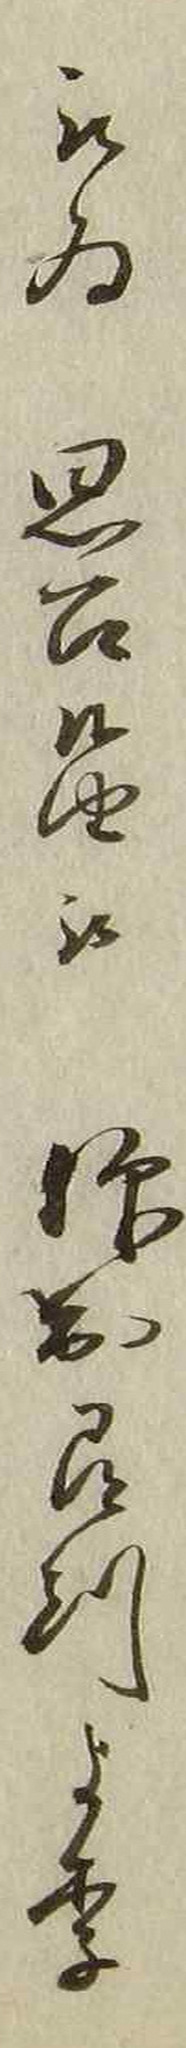被為思召候由被仰出即刻より
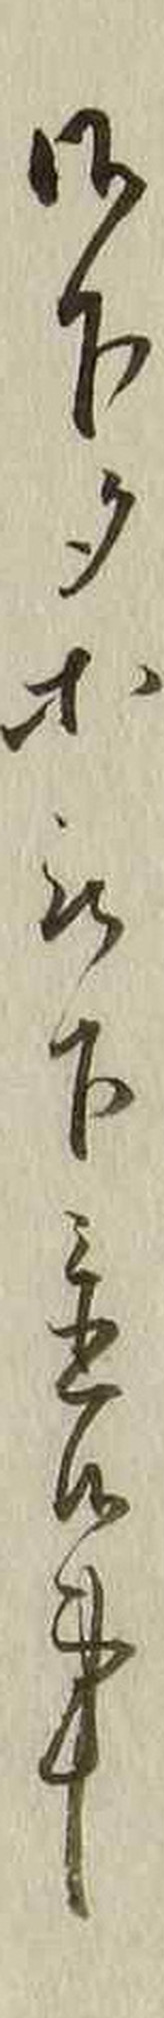御下タ等被下置候事
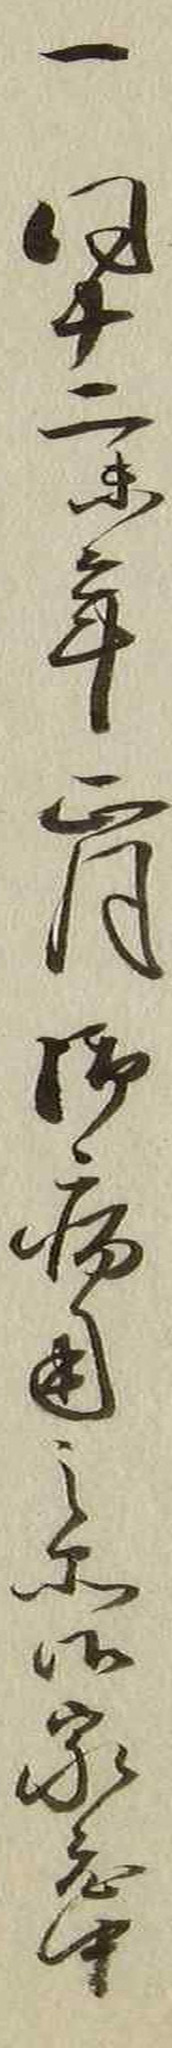一同十二未年正月御病用之所御家老中
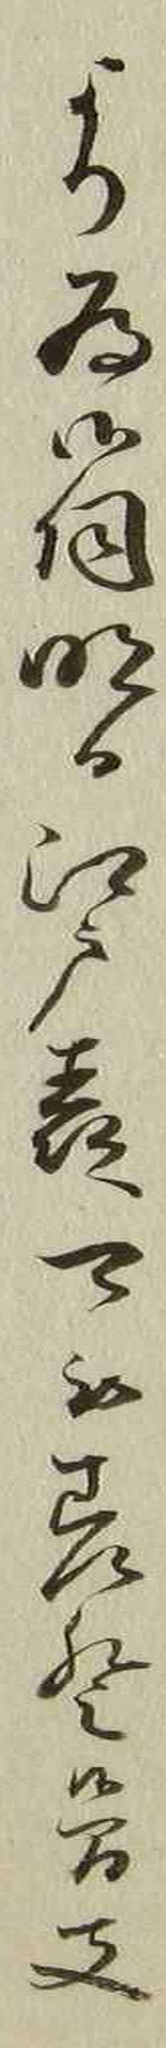より為御伺明日江戸表へ可被差登候間支
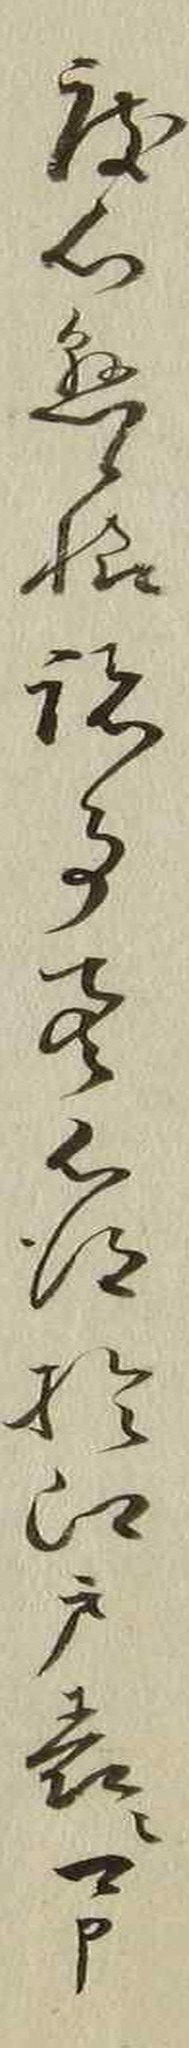度心懸候様諸事有心得於江戸表ニ可申
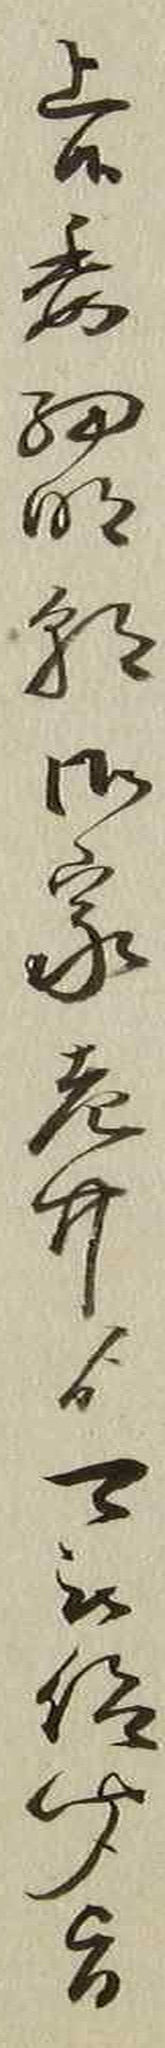上候委細明朝御家老中ゟ可被仰聞旨
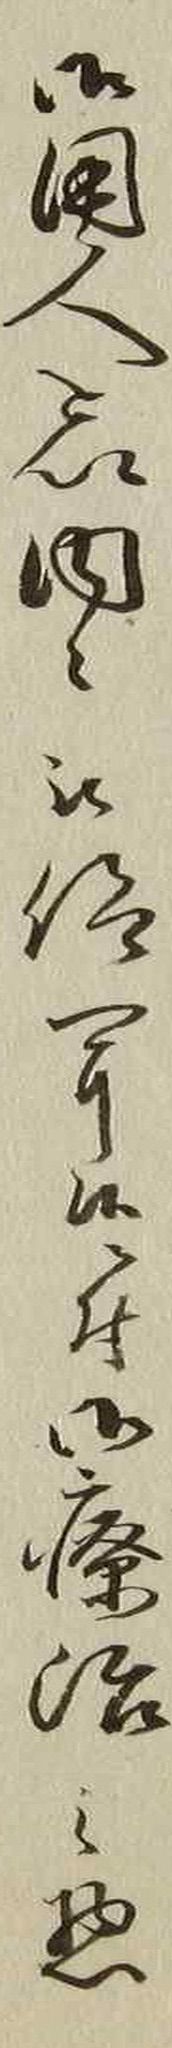御用人を以内々被仰聞候ニ付御療治之惣
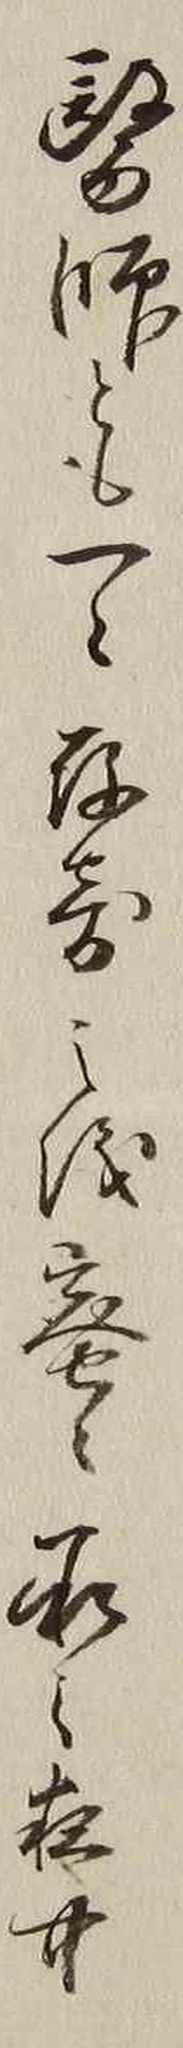医師とも一々存寄之儀蜜々承之夜中
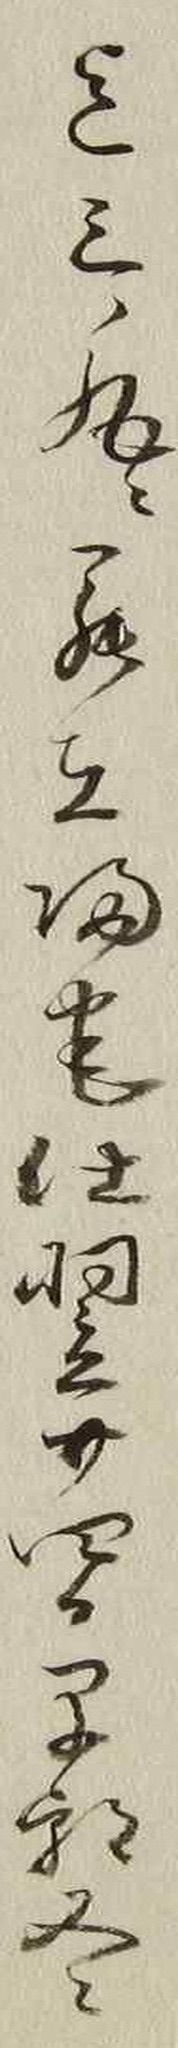迄三ノ丸ニ罷在帰宅仕翌廿四日早朝又々
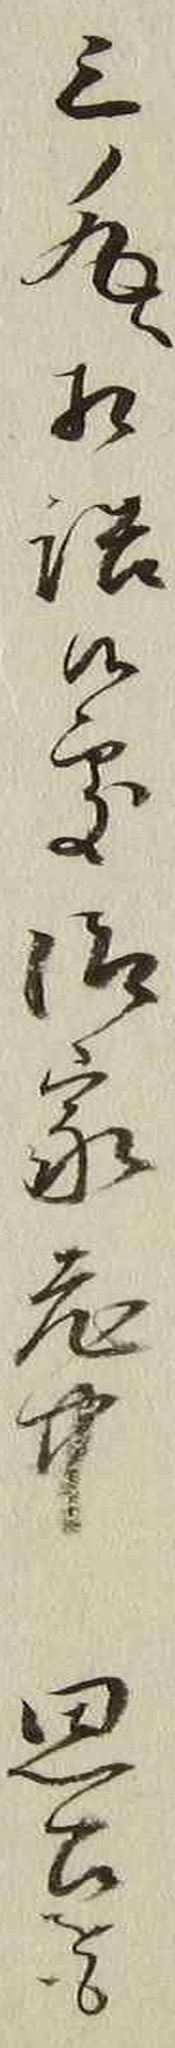三ノ丸へ相詰候処御家老中思召をも
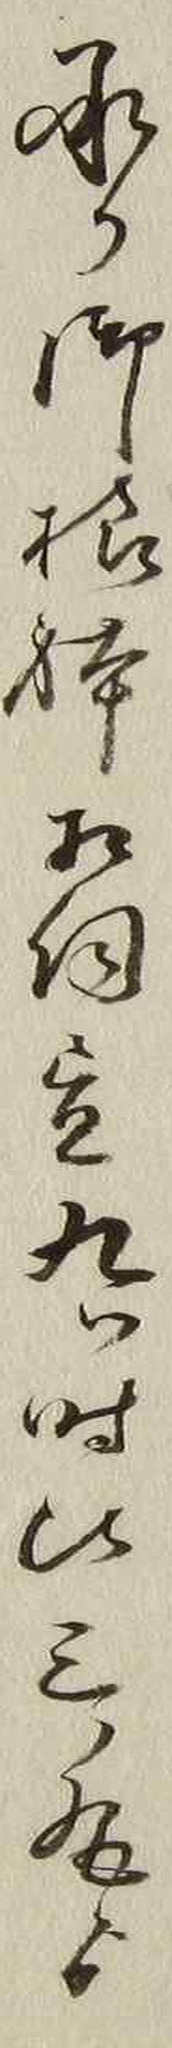承り御様体相伺昼九ツ時比三ノ丸ゟ
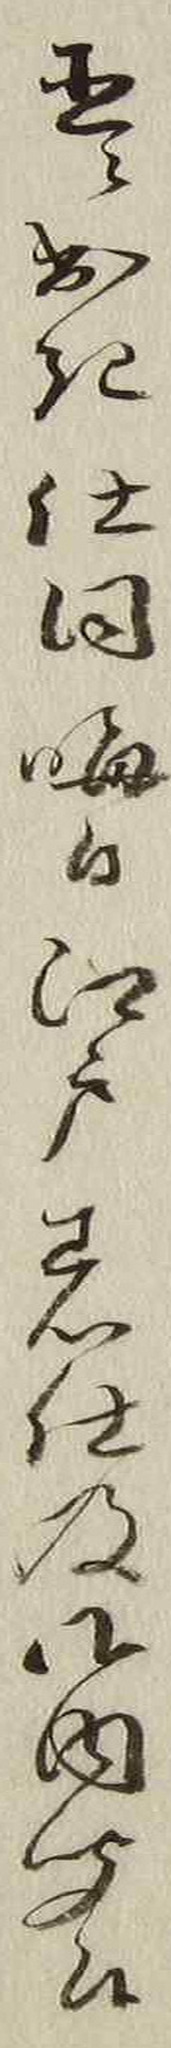直ニ出起仕同晦日江戸着仕及御内聞候
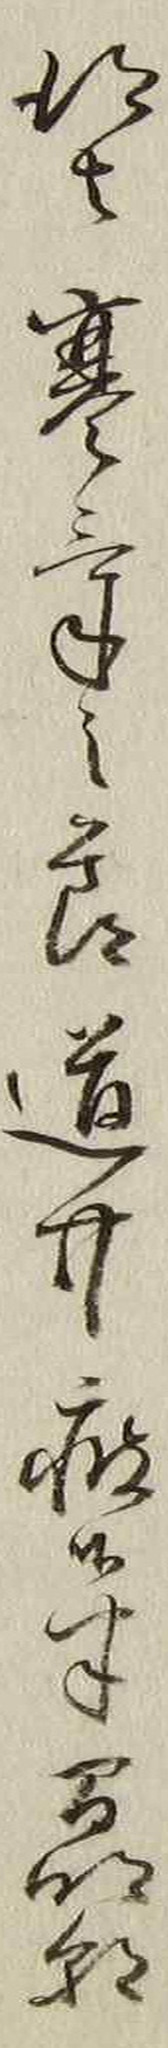得者寒気之節道中疲候半間明朝
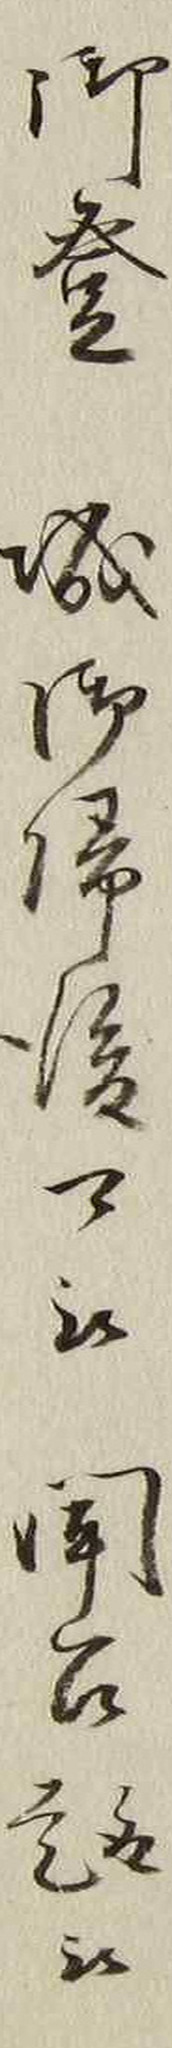御登城御帰後可被聞召趣被
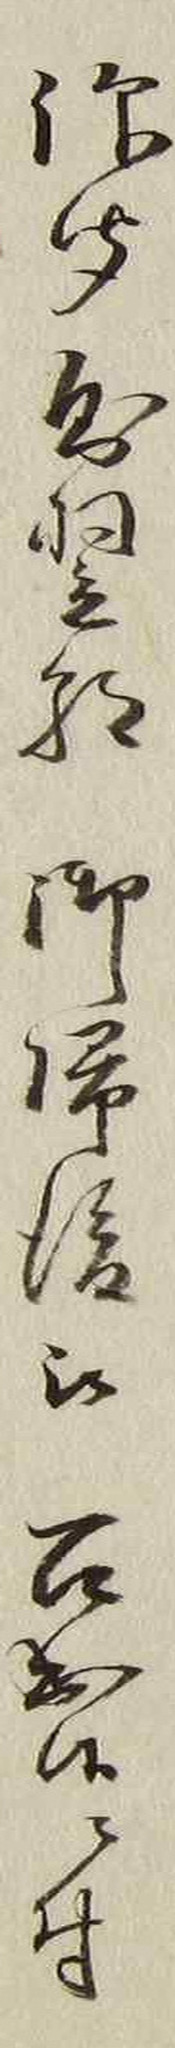仰聞則翌朝御帰被召出候ニ付
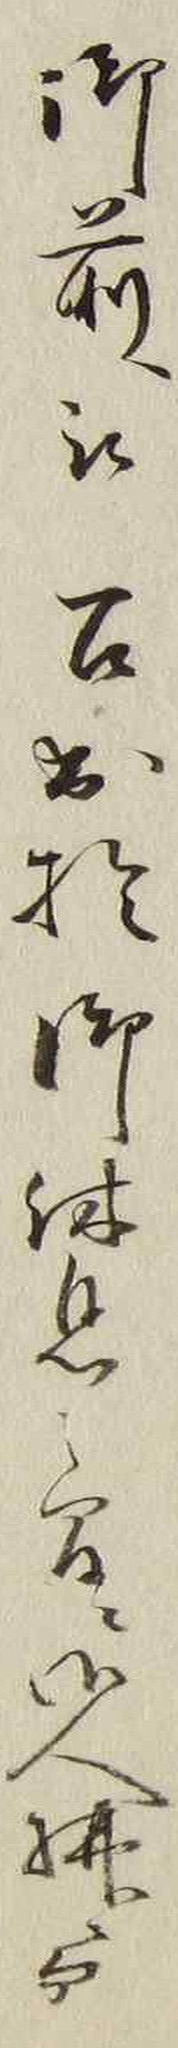御前へ被召出於御休息之間ニ御人払ニ而
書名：諸士系譜　巻之28　い之部28
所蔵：会津若松市立会津図書館
